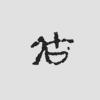居
